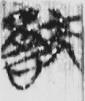○（胡）
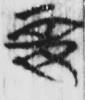妾
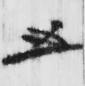之
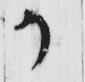人
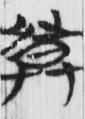登
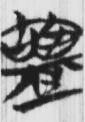○（盬）
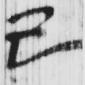己
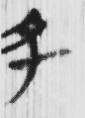丑
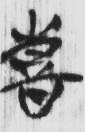喜
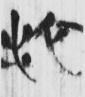沱
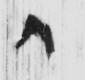人
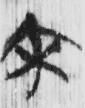宋
